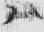八
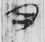月
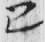己
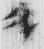丑
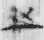之
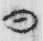日
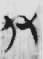付
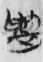○（舉）
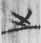之
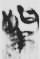○（關）
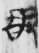敔
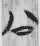公
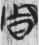周
